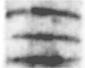三
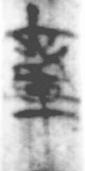𨍱（乘）
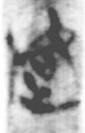○（路）
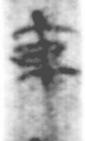車
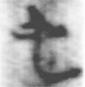屯
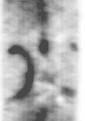亓（其）
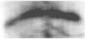一
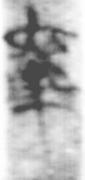𨍱（乘）
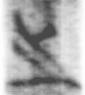之
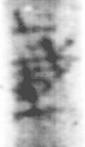載
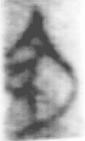糿
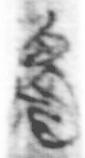褢
